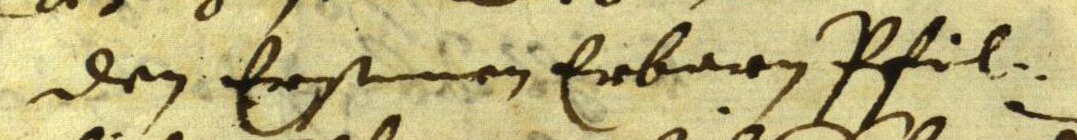den Ersamen Erbarn Pfil¬
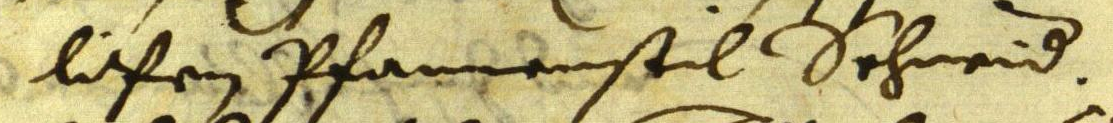liPen Pfannenstil Schneid.
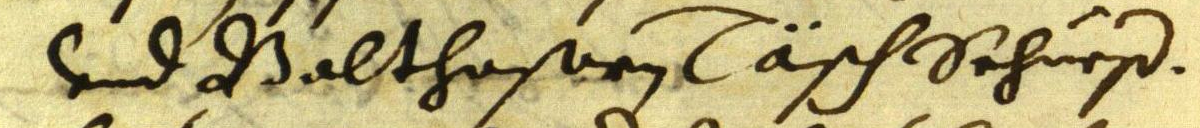vnd Balthasarn Täsch Schūest.
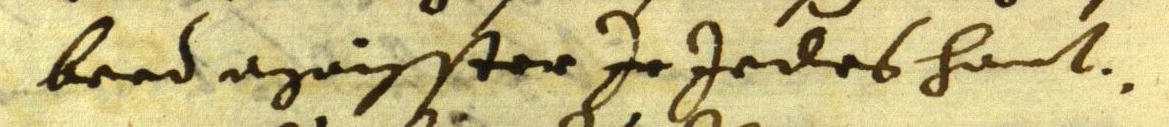beed maisster Ir Jedes hant¬
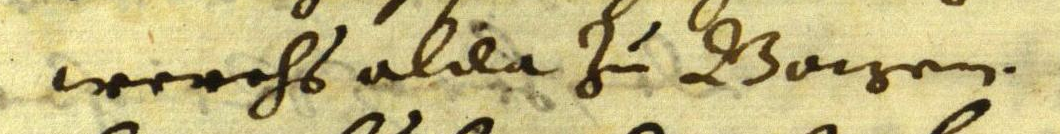werchs alda Zū Bozen.
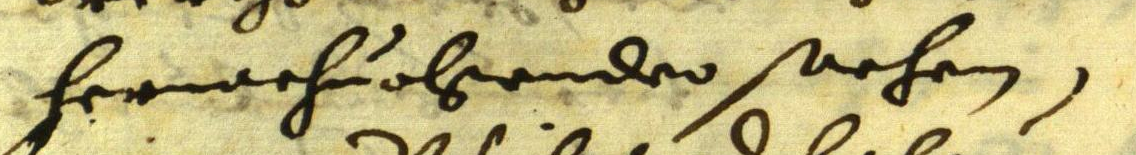Hernachūolgender sachen
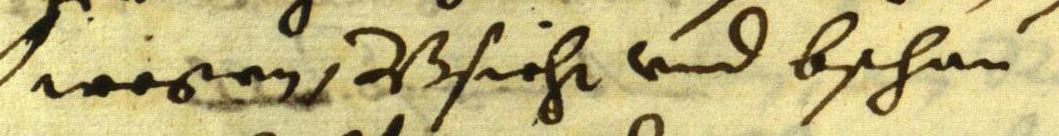wegen, Bsicht vnd bschaū
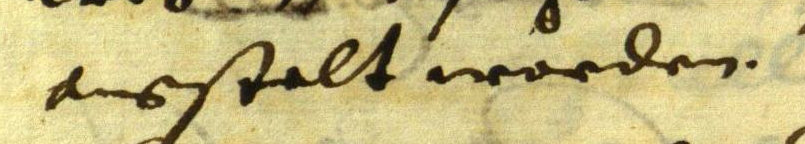angestelt worden.
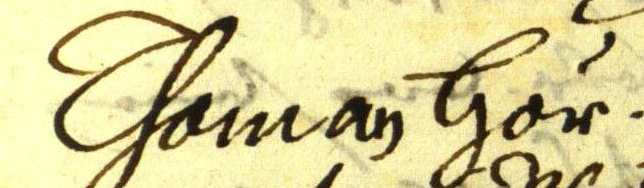Thoman Hōr¬
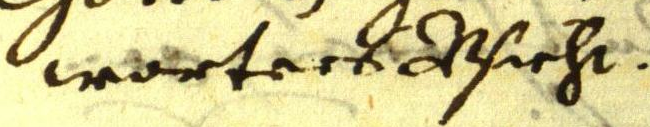warters Bsicht.
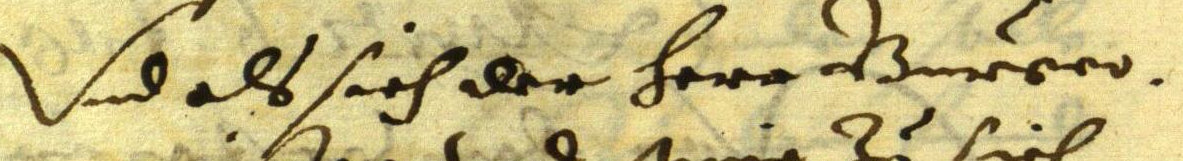Vnd als sich der herr Būrger¬
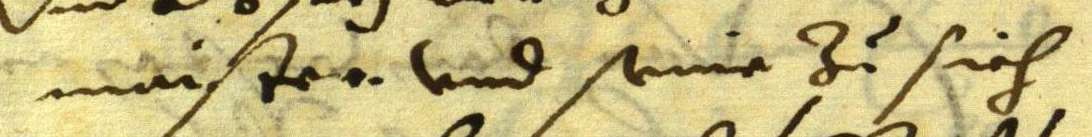maister. vnd seine Zū sich
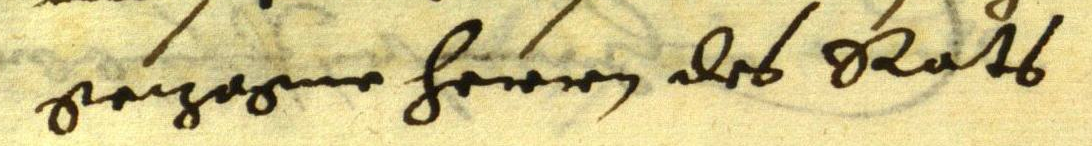gezogne herrn des Rats
